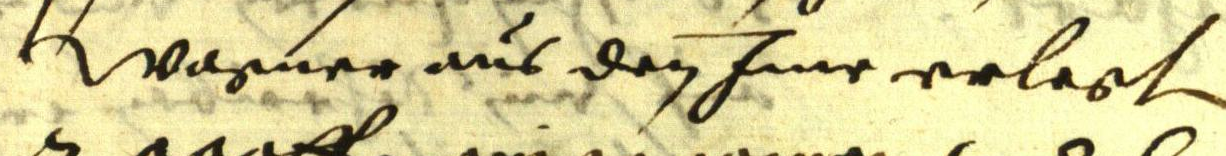Wagner aūs den Ime erlegt
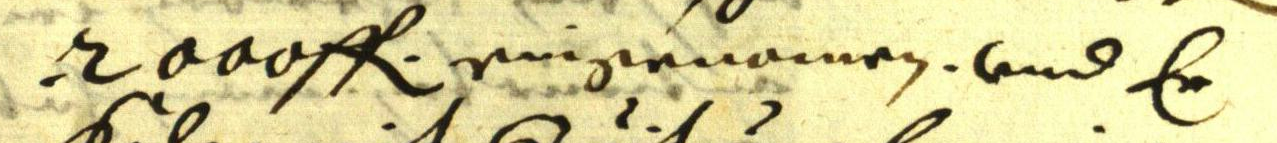.2000 fl. eingenomen. vnd Er
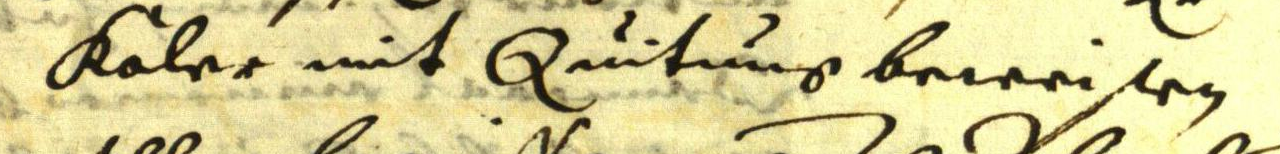Koler mit Qūitūng beweisen
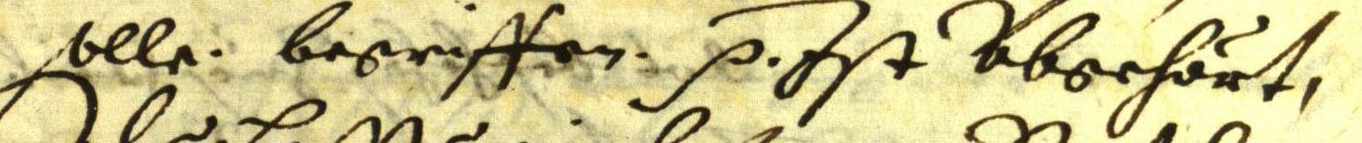solle. begriffen etc. Ist Abgehōrt,
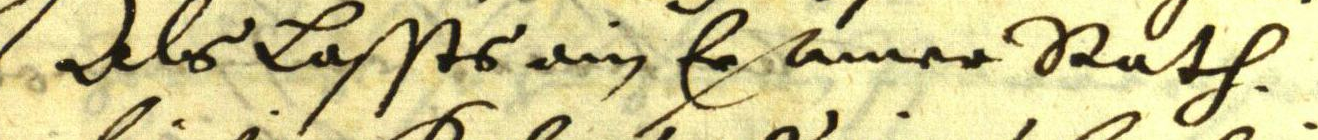Als Lassts ain Ersamer Rath.
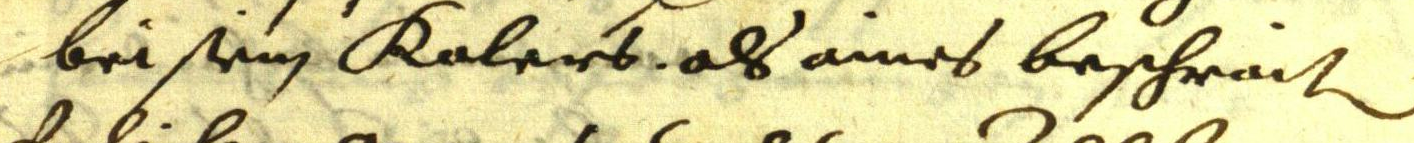bei sein Kolers. als aines beschrait
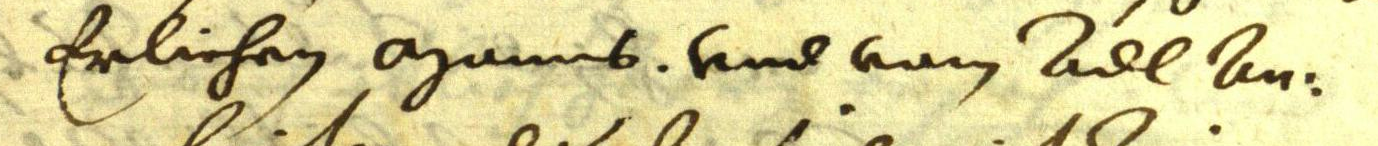Erlichen Manns. vnd vom Adl An¬
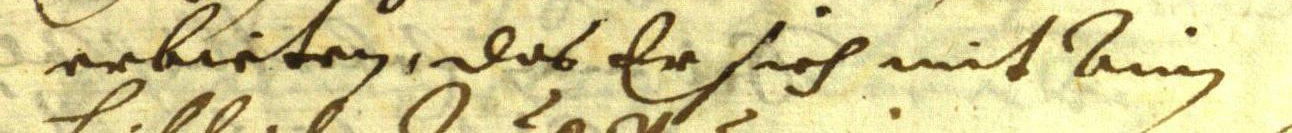erbieten, das Er sich mit Aim
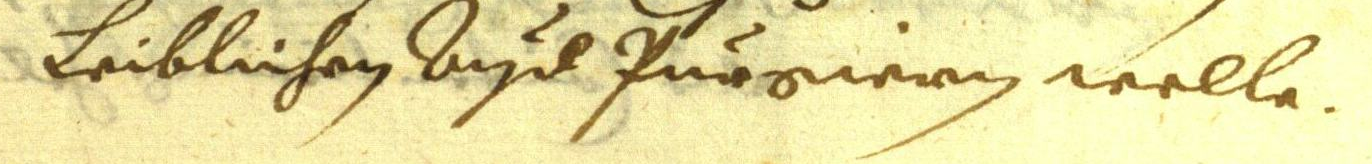Leiblichen Aȳd Pūrgiern welle.
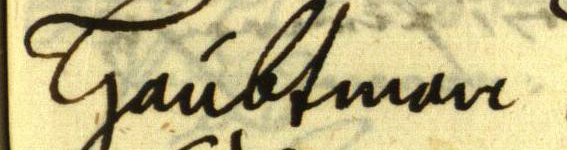Haūbtman
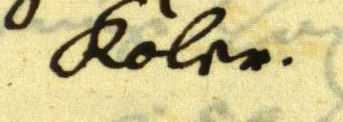Kōler.
